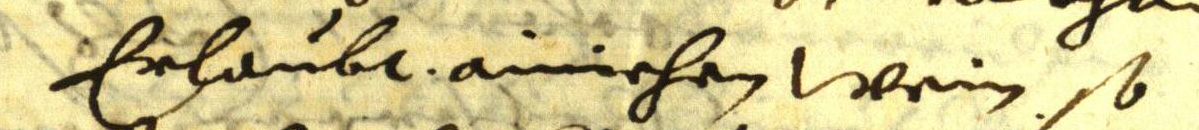Erlaūbt. ainichen Wein. so
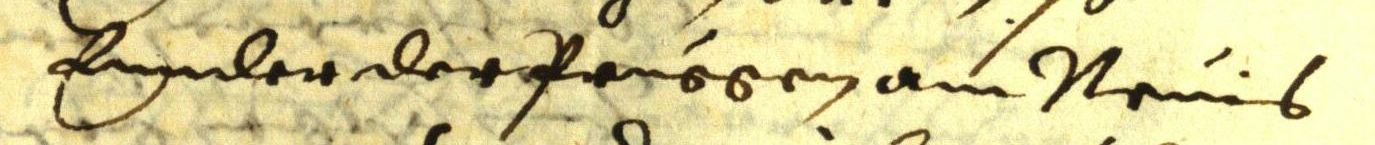Ennder der Prūggen ain Neūis
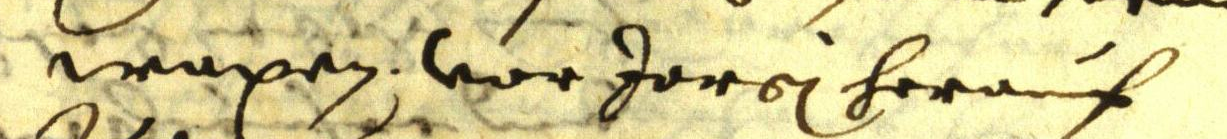waxen. vor Jorgj heraūf
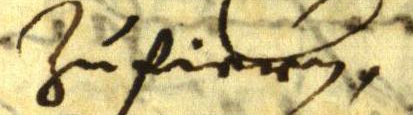Zū fiern,
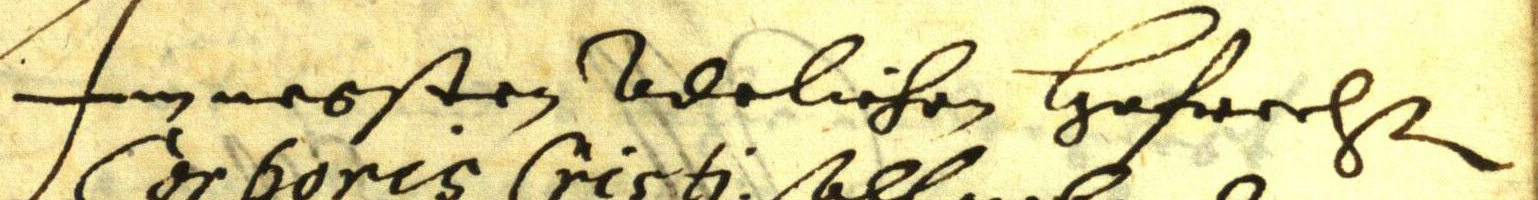Im negsten Adelichen Hofrecht
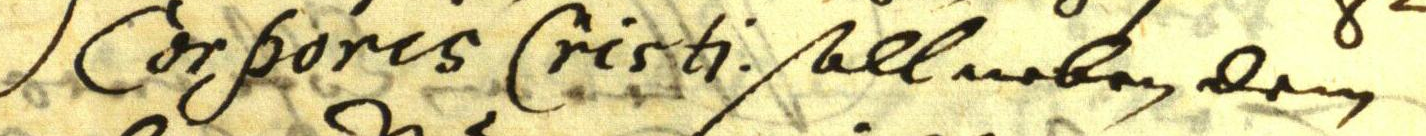Corporis Cristi. soll neben dem
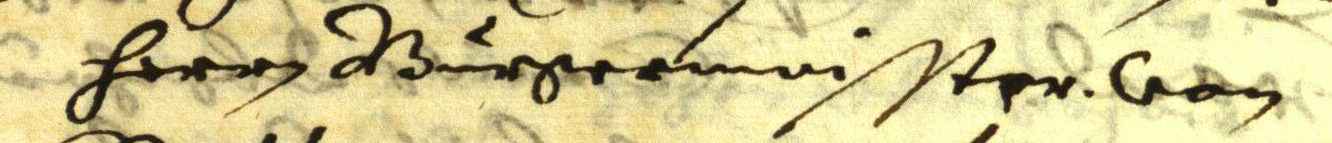herrn Būrgermaisster. von
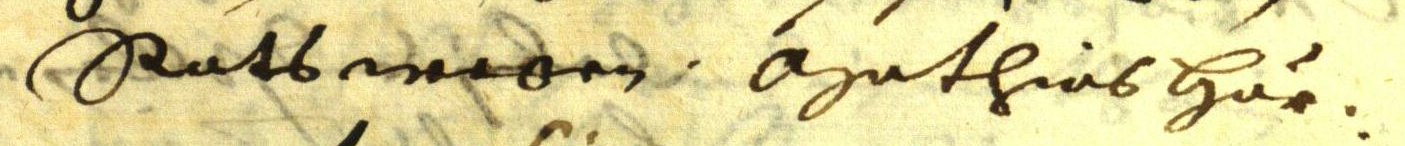Rats wegen. Mathias Hōr¬
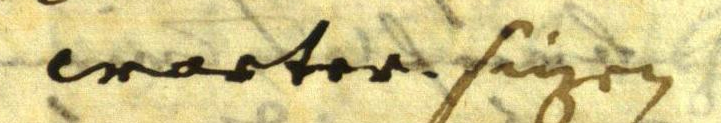warter sizen
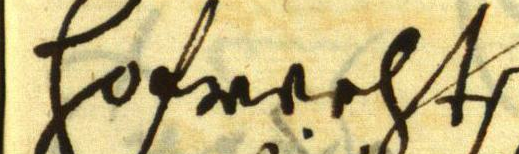Hofrechts¬
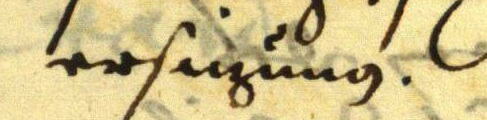ersizūng.
